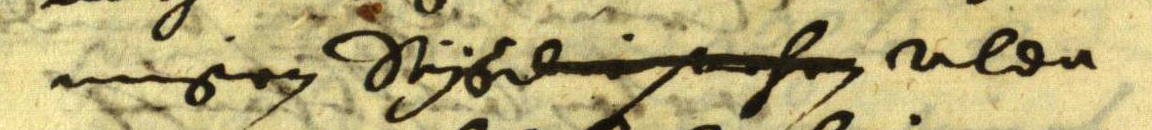migen Sÿs die sachen Alda
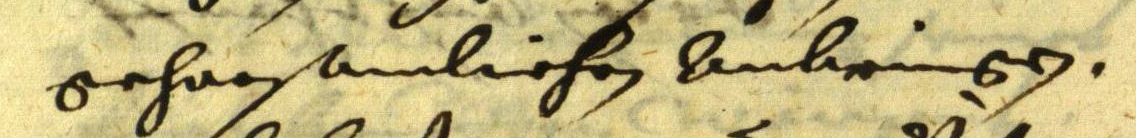gehorsamlichen Anbringen.
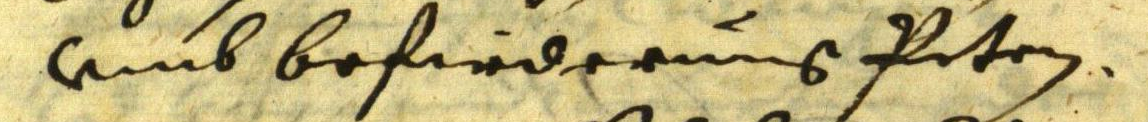vmb befirderūng Piten.
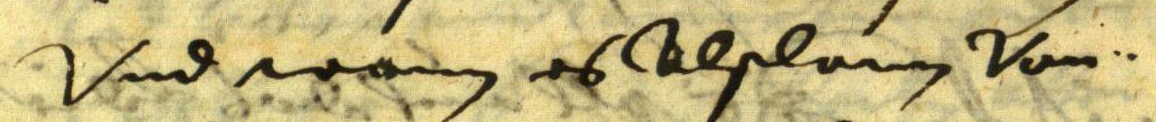Vnd wann es Alsdann Von¬
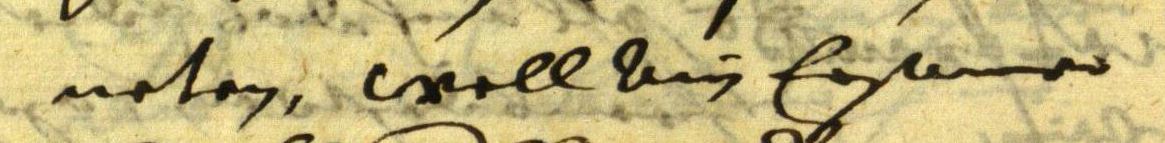neten, well Ain Ersamer
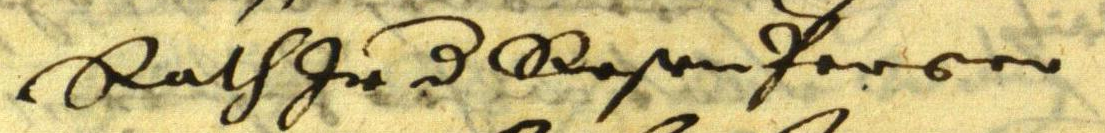Rath Ir d ResenPerger
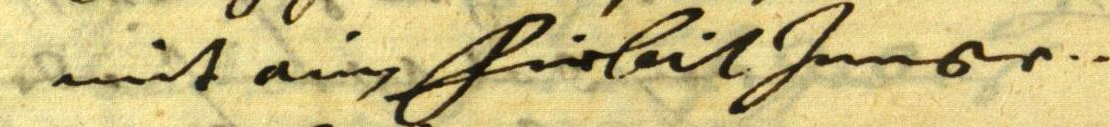mit aim Firbit Innge¬
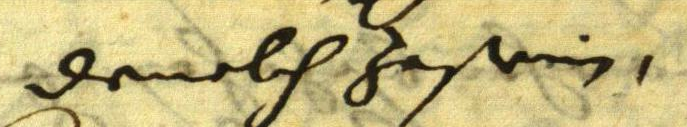denckh Zesein,
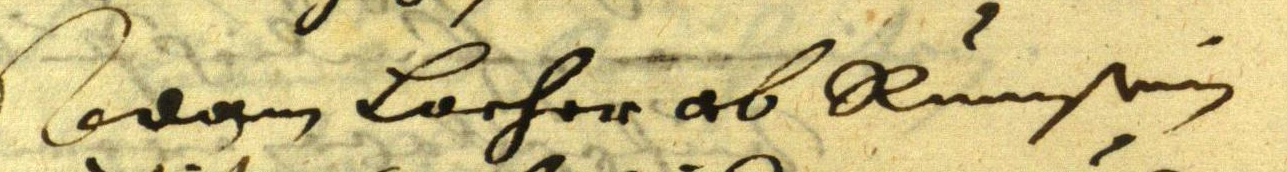Adam Locher ob Rūmsein
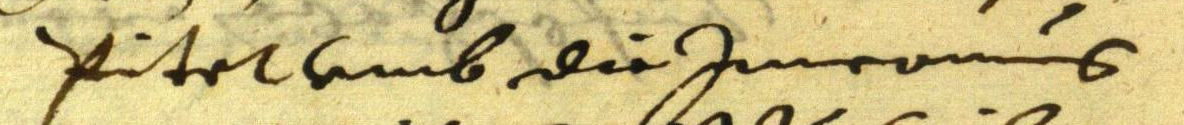Pitet vmb die Inwonūng
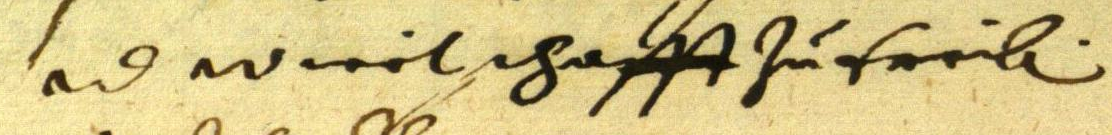vnd wiertschafft Zū treib.
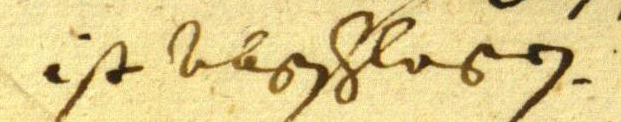ist Abgschlagen.
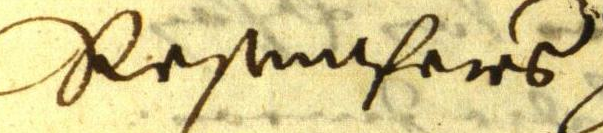Resenperg
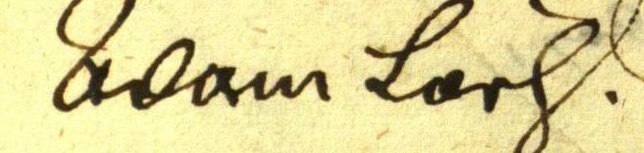Adam Loch.
